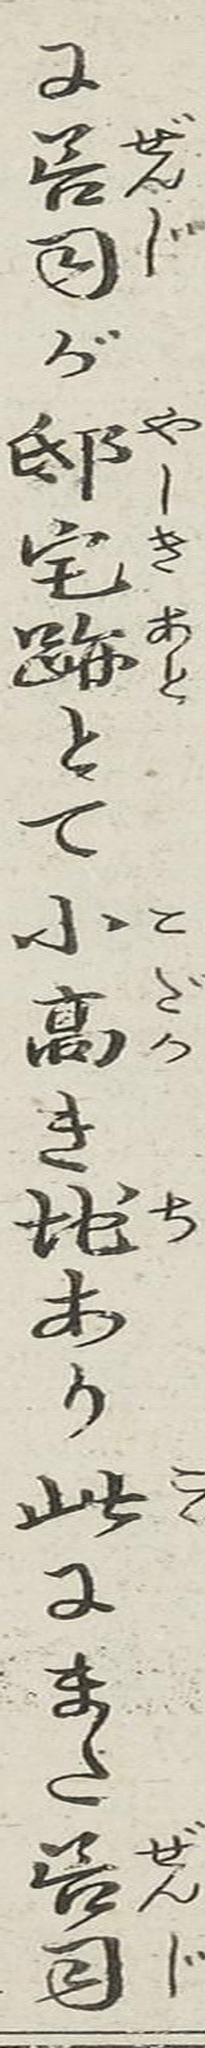に善司が邸宅跡とて小高き地あり此にまた善司
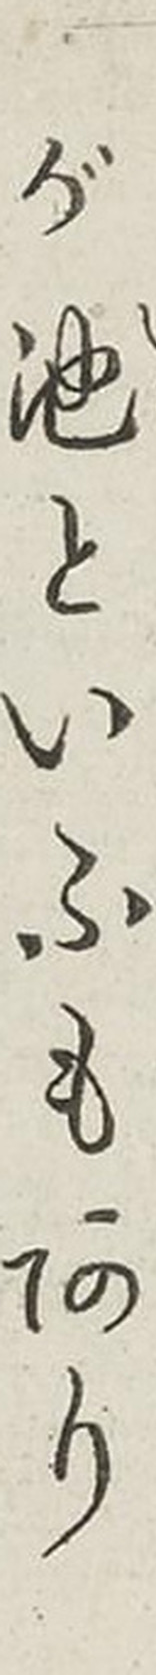が池といふもあり
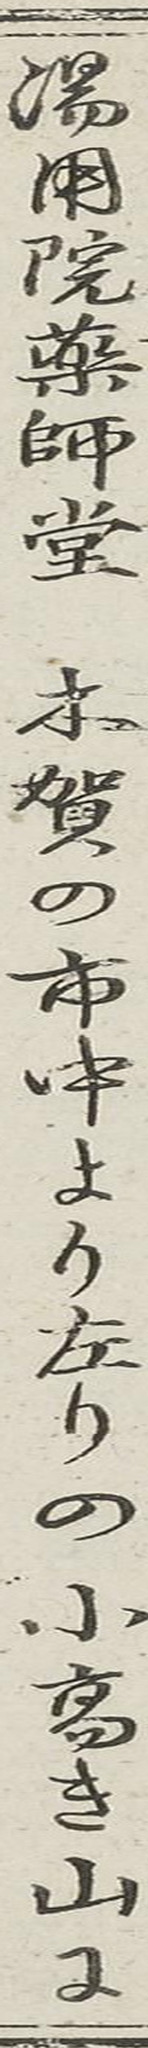湯用院薬師堂木賀の市中より左りの小高き山に
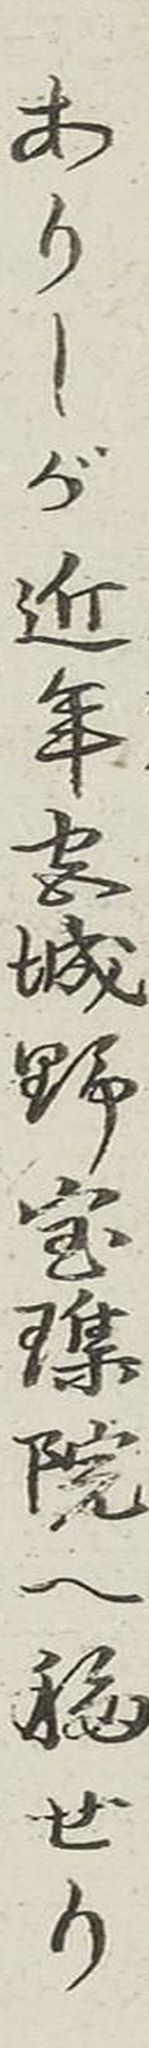ありしが近年宮城野宝珠院へ移せり
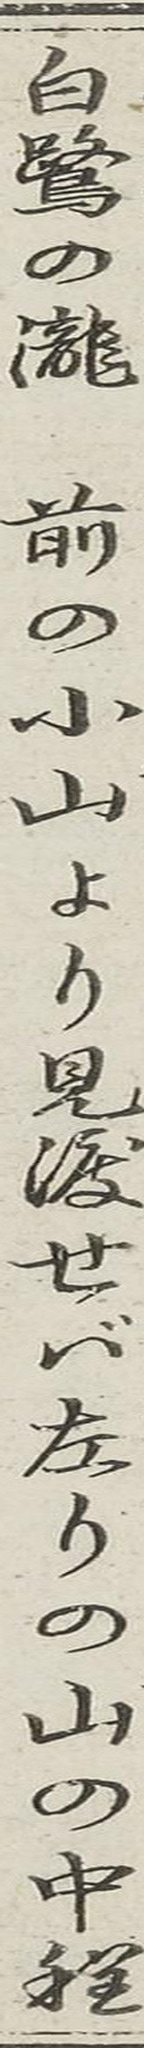白鷺の瀧前の小山より見渡せば左りの山の中程
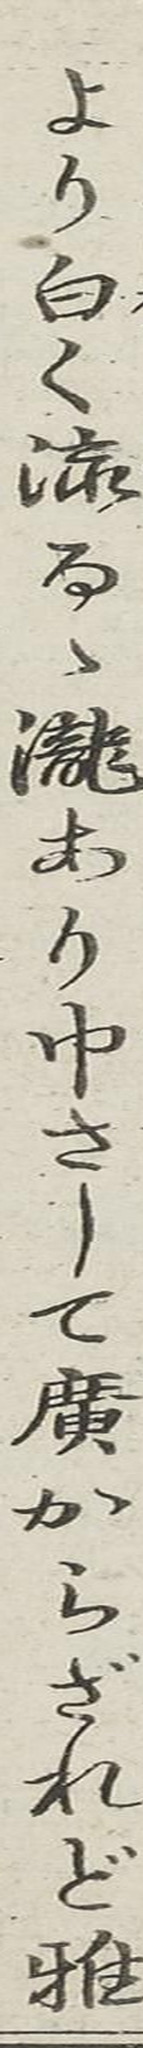より白く流るゝ瀧あり巾さして廣からざれど雅
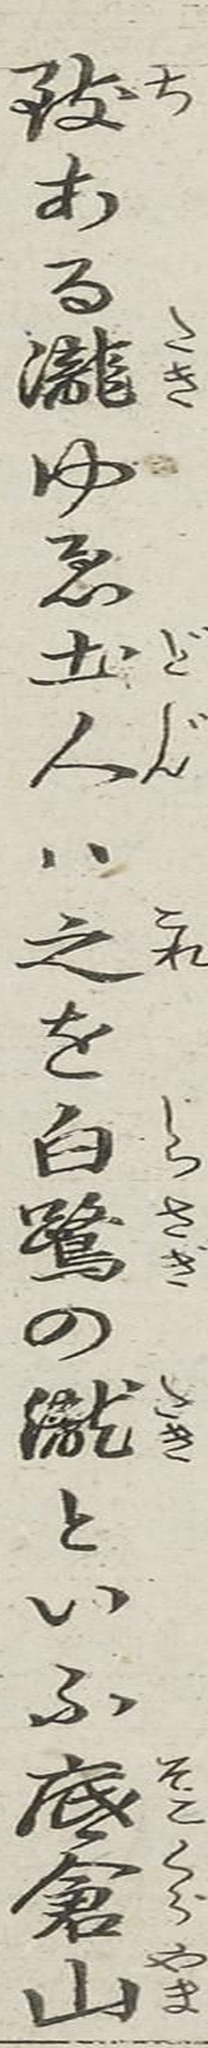致ある瀧ゆゑ土人は之を白鷺の瀧といふ底倉山
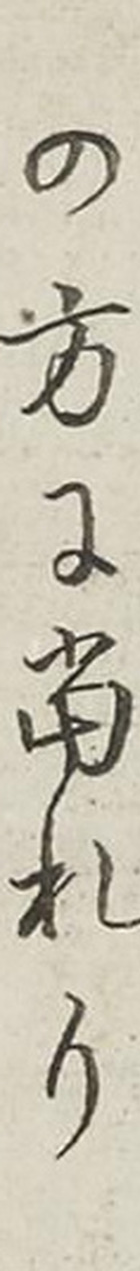の方に当れり
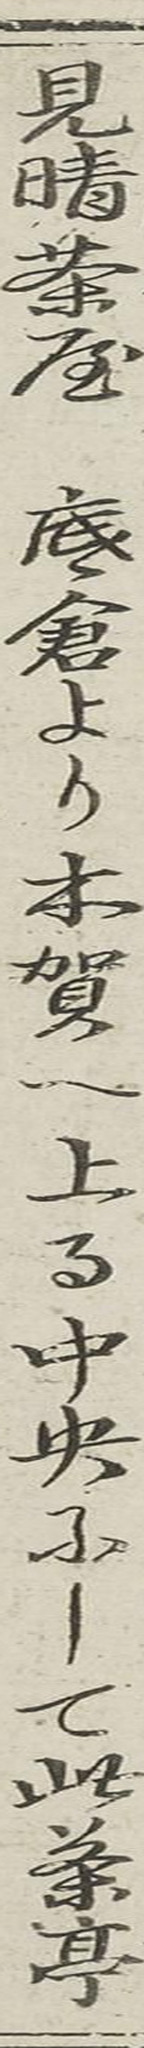見晴茶屋底倉より木賀へ上る中央にして此茶亭

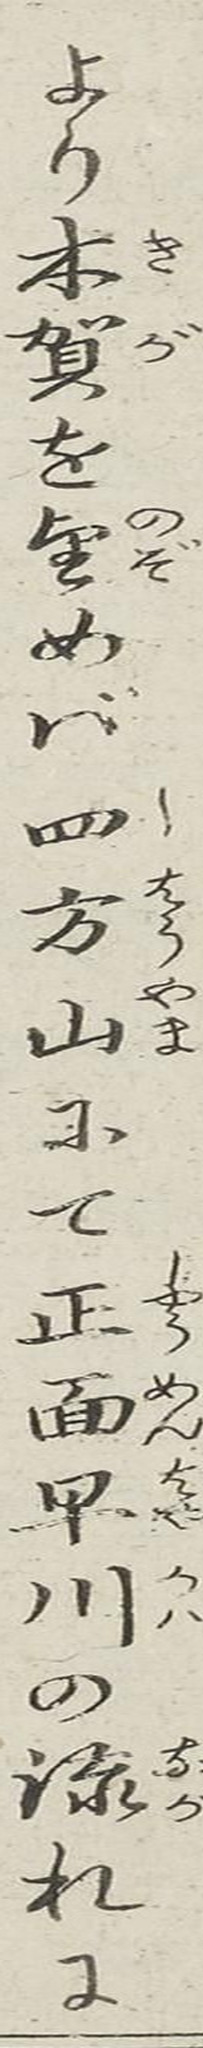より木賀を望めば四方山にて正面早川の流れに
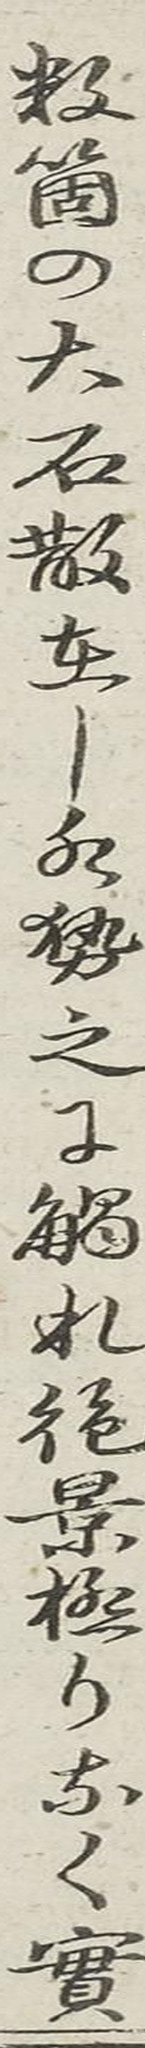数箇の大石散在し水勢之に触れ絶景極りなく実
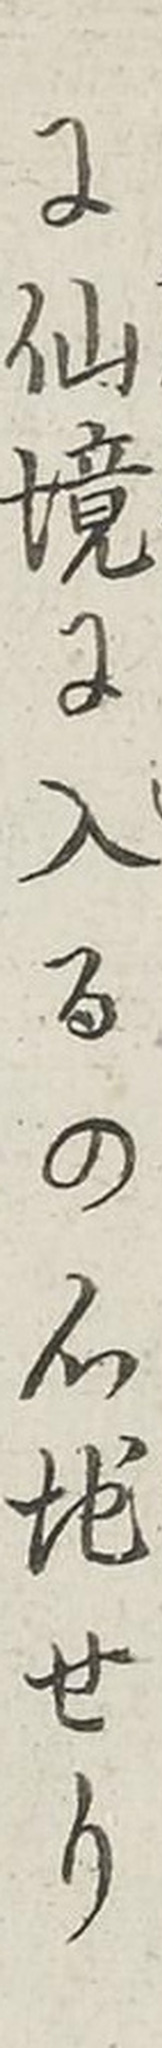に仙境に入るの心地せり
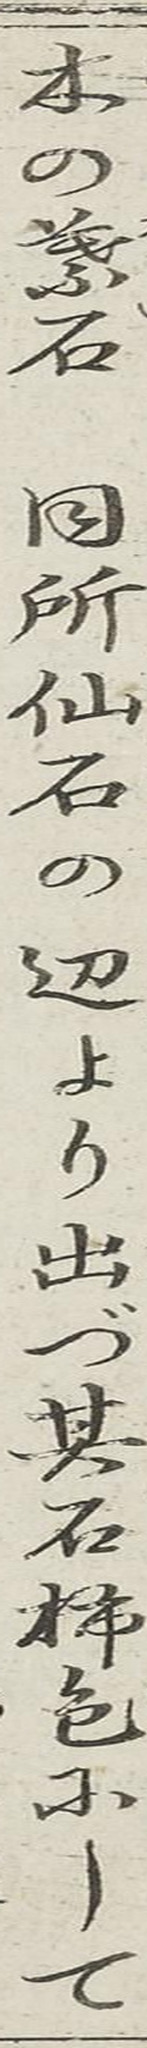木の葉石同所仙石の辺より出づ其石柿色にして
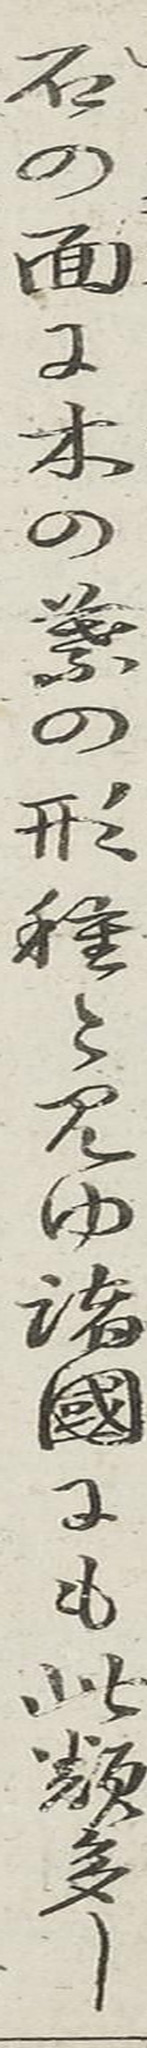石の面に木の葉の形種〻見ゆ諸国にも此類多し
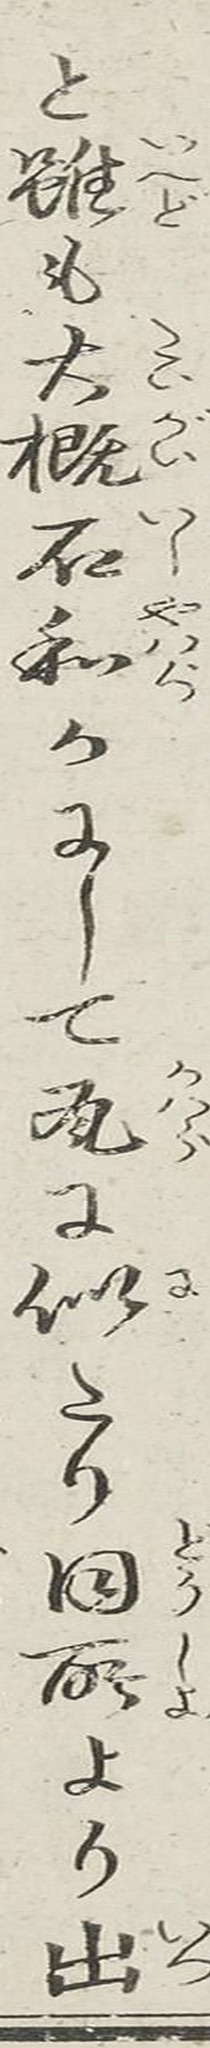と雖も大概石和かにして瓦に似たり同所より出
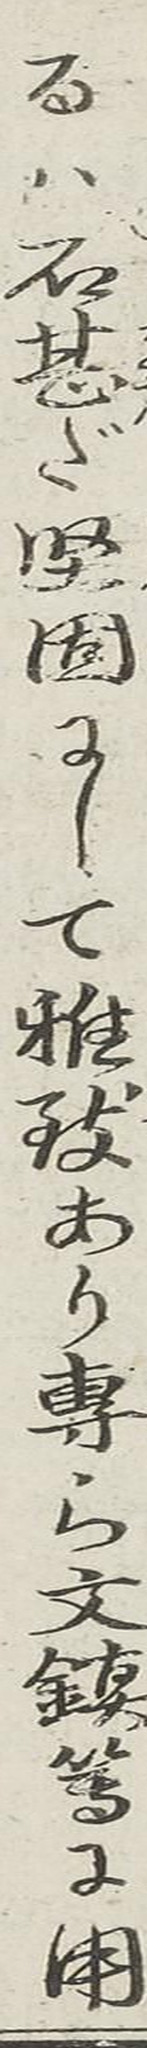るは石甚だ堅固にして雅致あり専ら文鎮等に用
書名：箱根温泉誌　全
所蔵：東京大学地震研究所図書室 Earthquake Research Institute Library, The University of Tokyo, JAPAN
